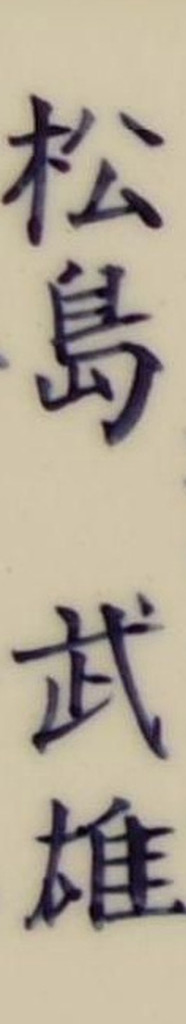松島武雄
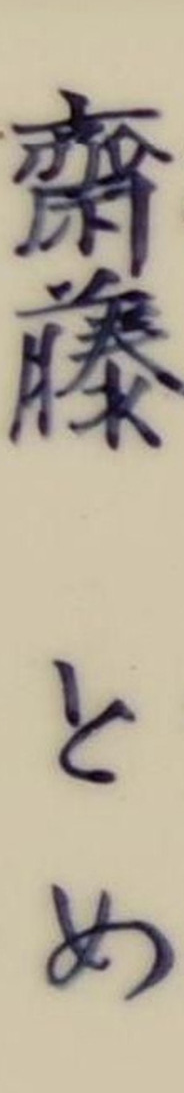斎藤とめ
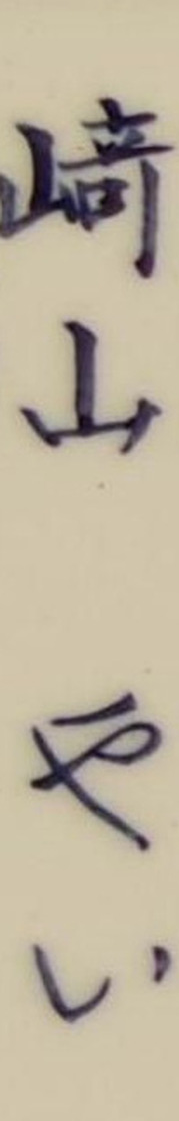崎山やい
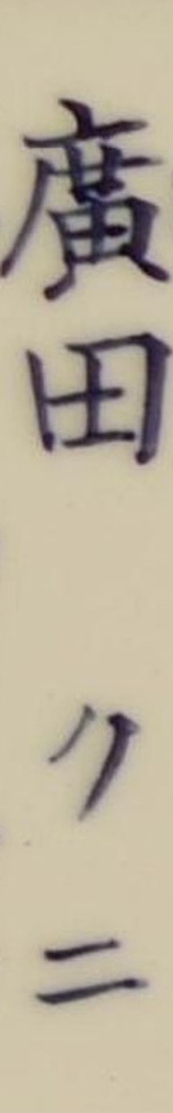廣田クニ
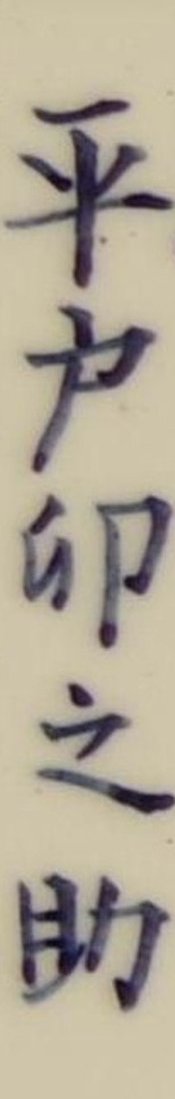平戸卯之助
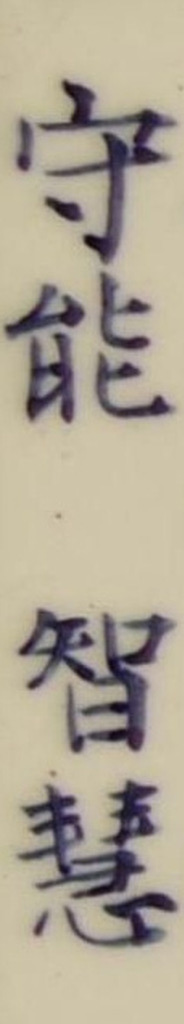守能智慧

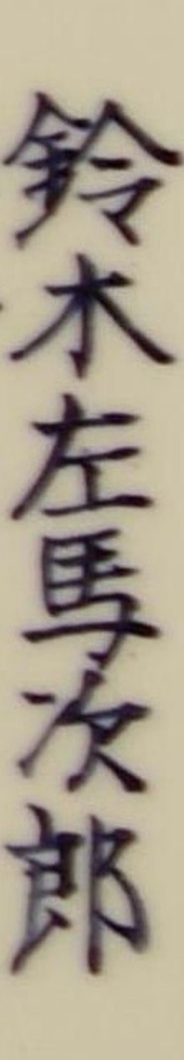鈴木左馬次郎
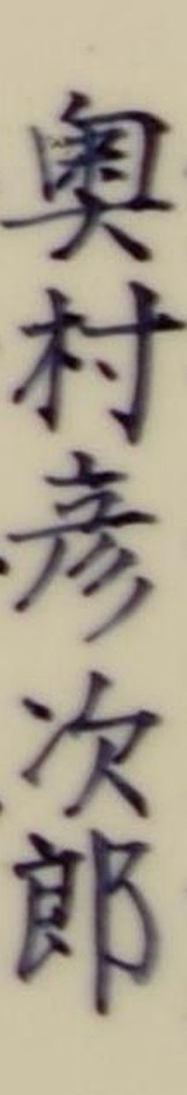奥村彦次郎
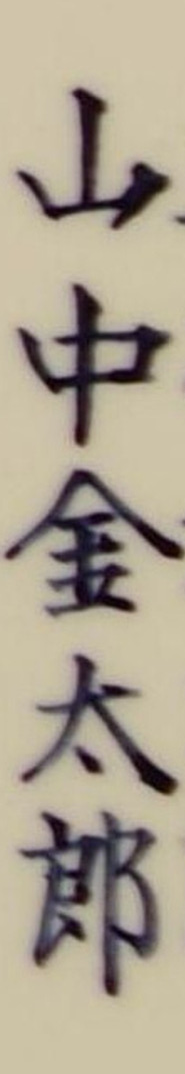山中金太郎
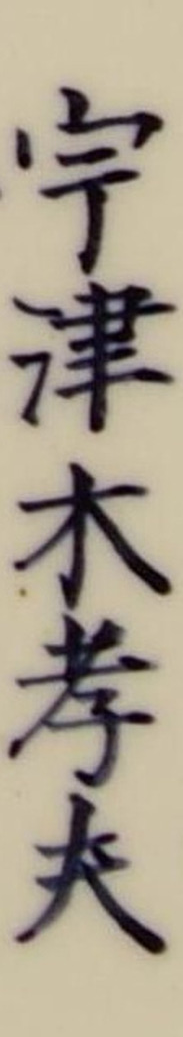宇津木孝夫
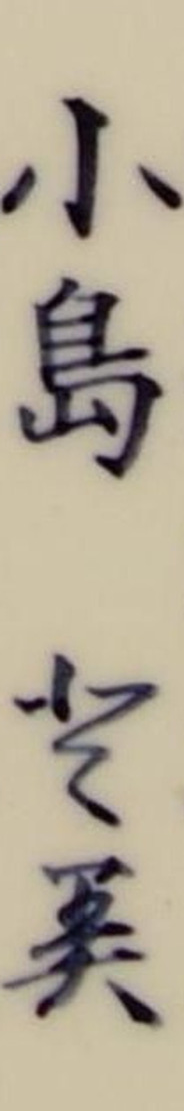小島とみ
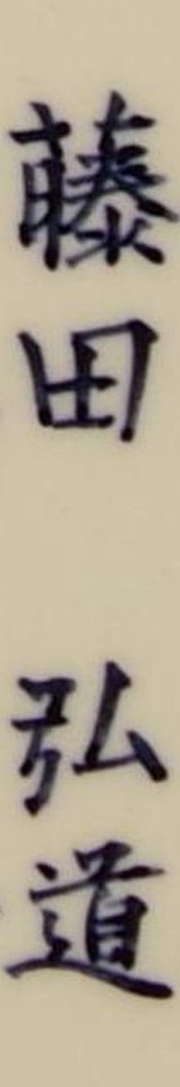藤田弘道
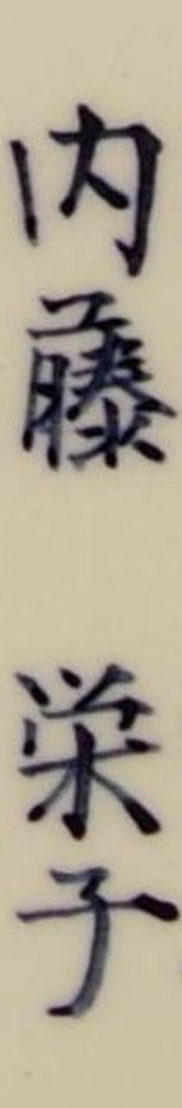内藤栄子
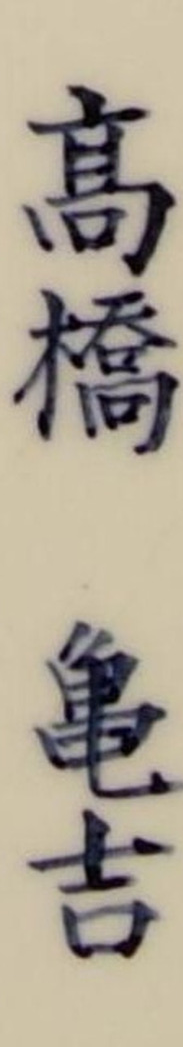高橋亀吉
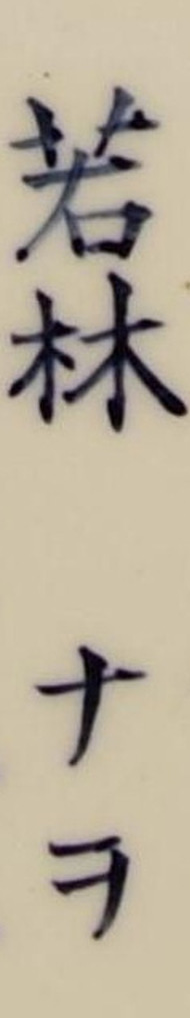若林ナヲ
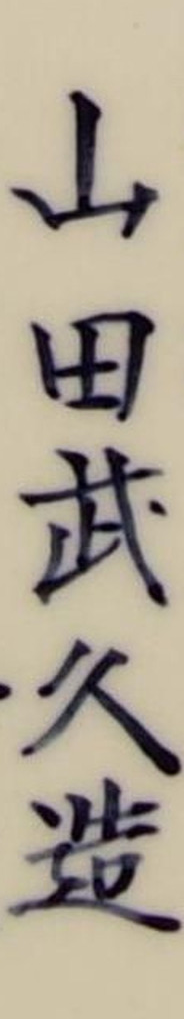山田武久造
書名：E~L
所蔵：高野山金剛峯寺
